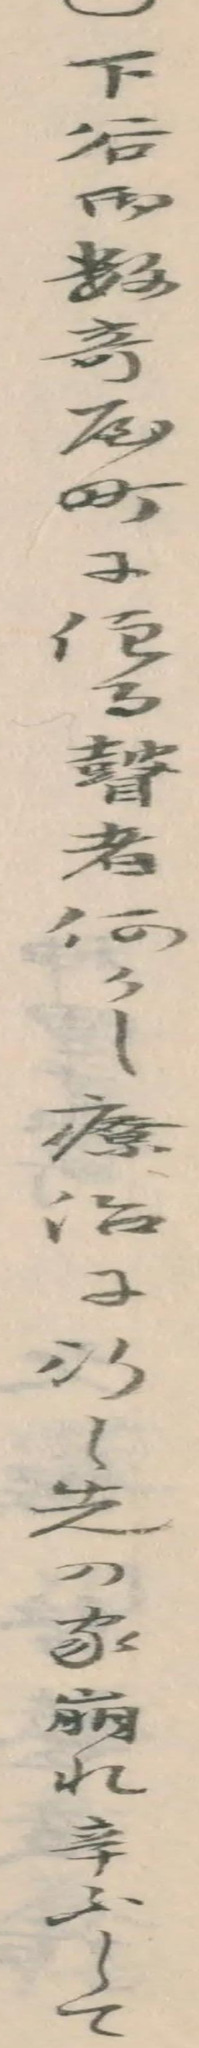〇下谷御数竒屋町に住る瞽者何かし療治に行し先の家崩れ辛ふして
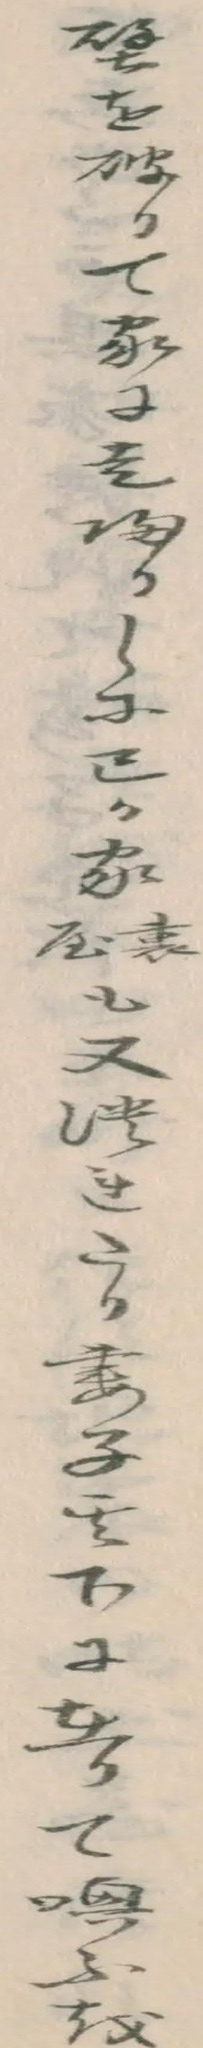壁を破りて家に走帰りしに己か家裏屋も又潰れたり妻子其下に在りて噢ふを
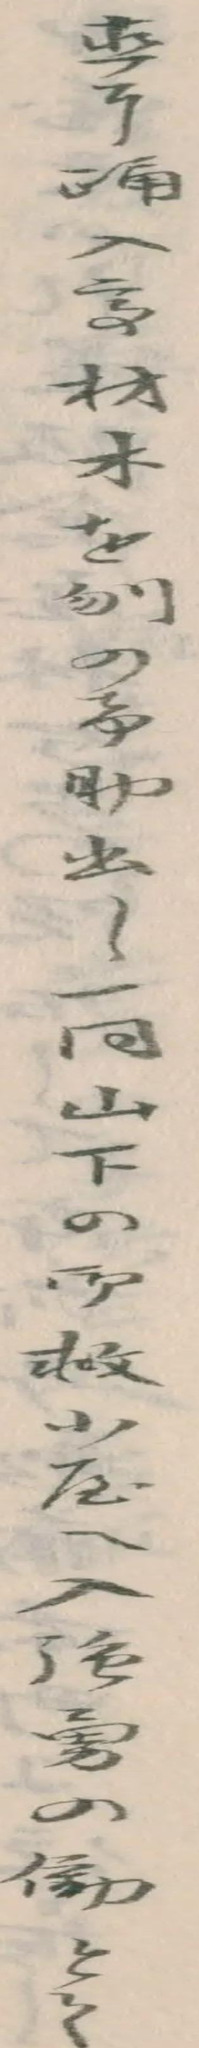直に踊入て材木を刎のけ助出し一同山下の御救小屋へ入強勇の働とて
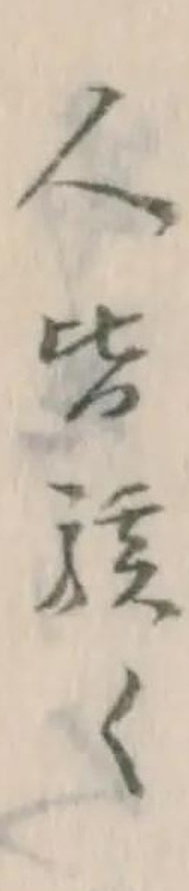人皆駭く
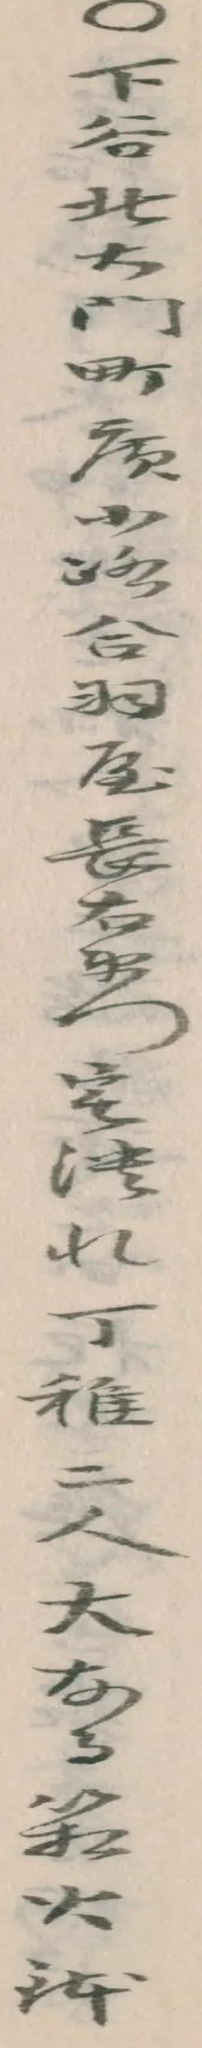〇下谷北大門町広小路合羽屋長右衛門宅潰れ丁稚二人大なる箱火鉢
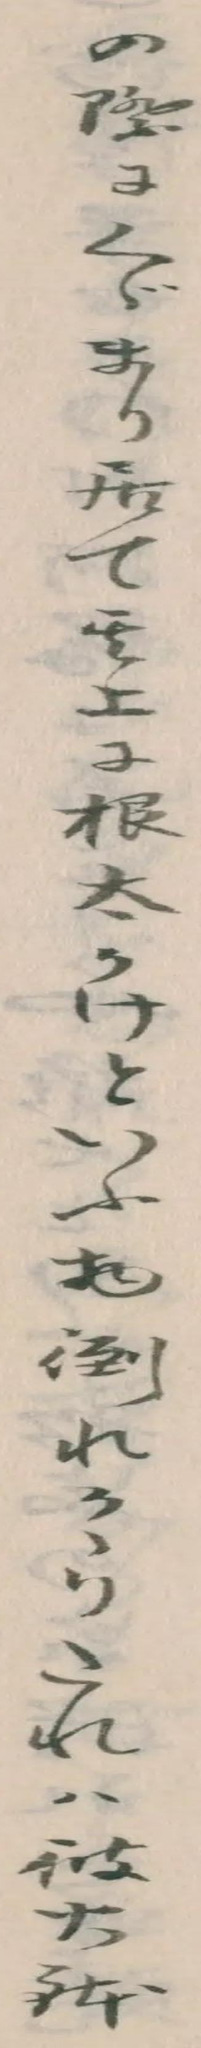の際にくゞまり居て其上に根太かけといふ物倒れかゝりこれは彼火鉢
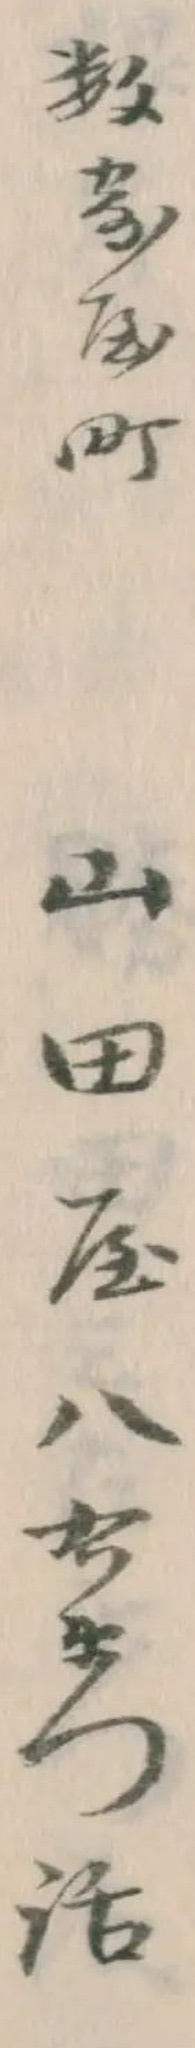数寄屋町山田屋八右衛門話
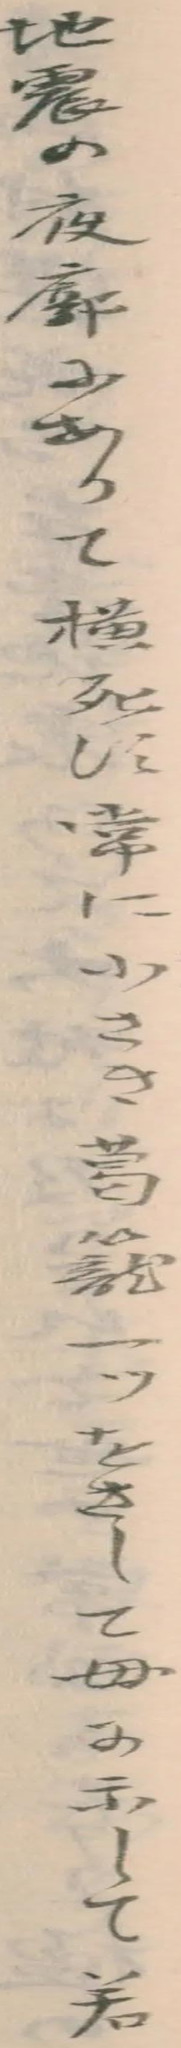地震の夜廓にありて横死す常に小さき葛籠一ツをさして母に示して若
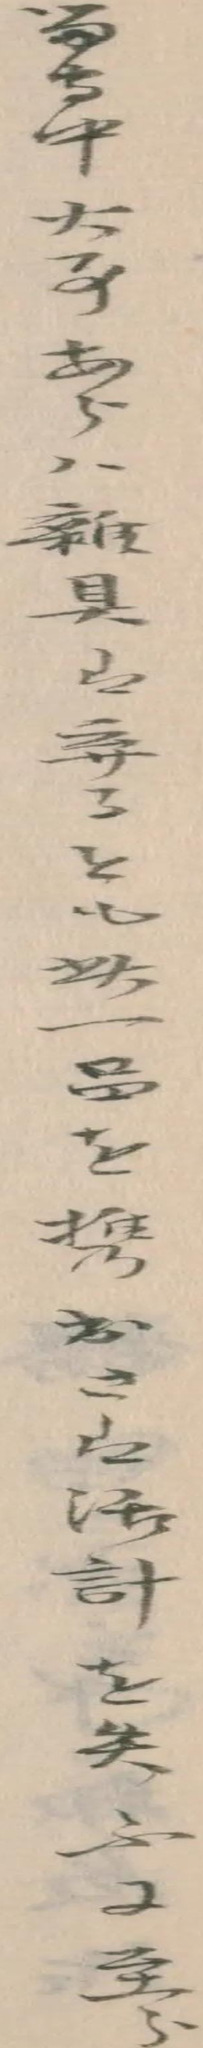留守中火事あらは雑具は弃るとも此一品を携出さは活計を失ふに至ら
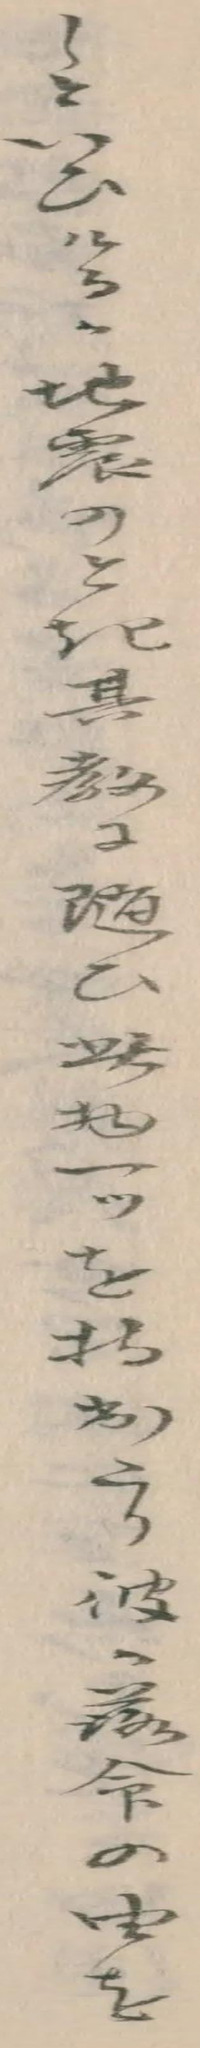しといひけるか地震のとき其教に随ひ此物一ツを持出たり彼か落命の由を
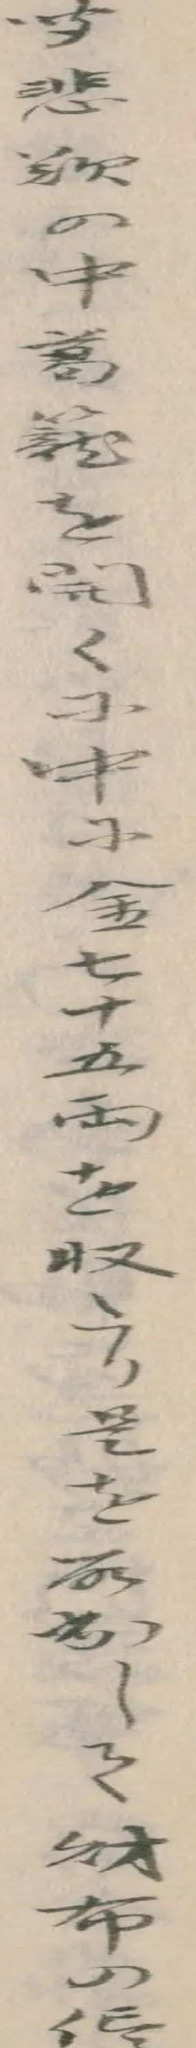聞悲歎の中葛籠を開くに中に金七十五両を収たり是を取出して財布の侭
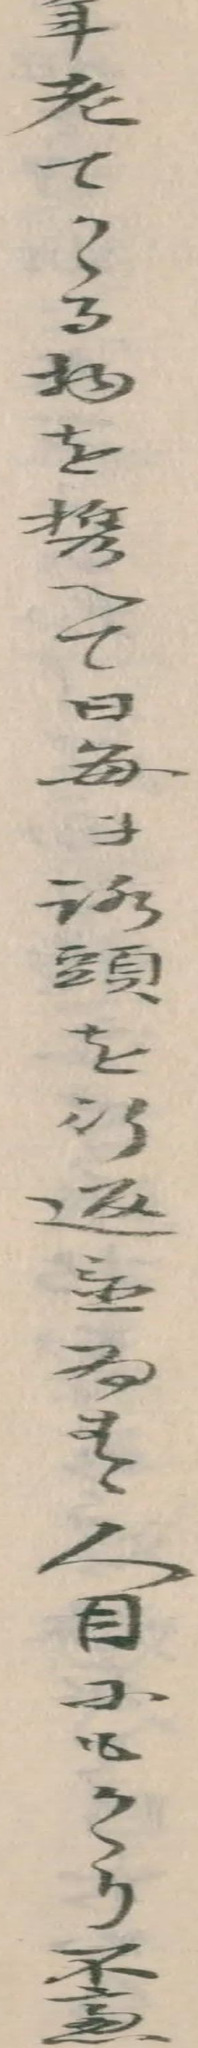年老てかゝる物を携へて日毎に路頭を行返置給はゝ人目にもかゝり不慮
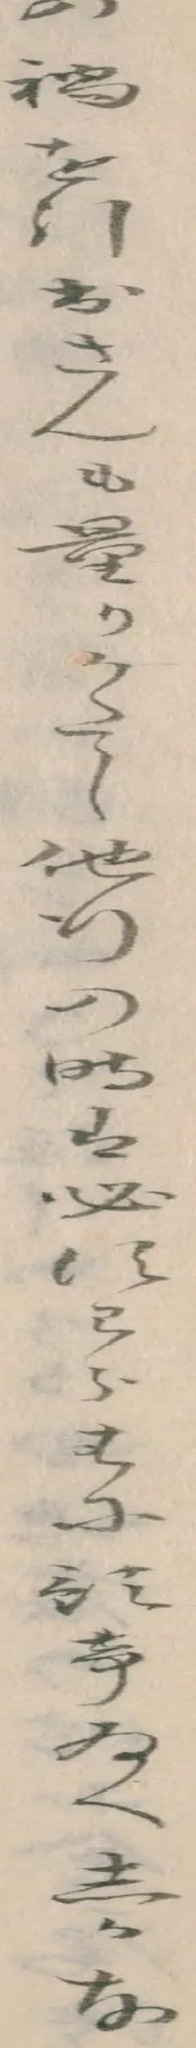の禍を引出さんも量りかたし他行の時は必すわらはに預て給へしかな
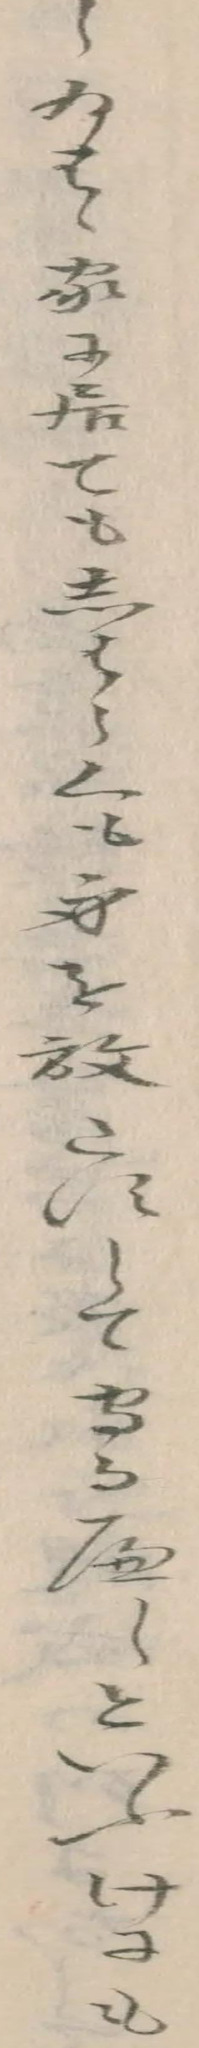し給はゝ家に居てもしはらくも身を放たすして守るへしといふけにも
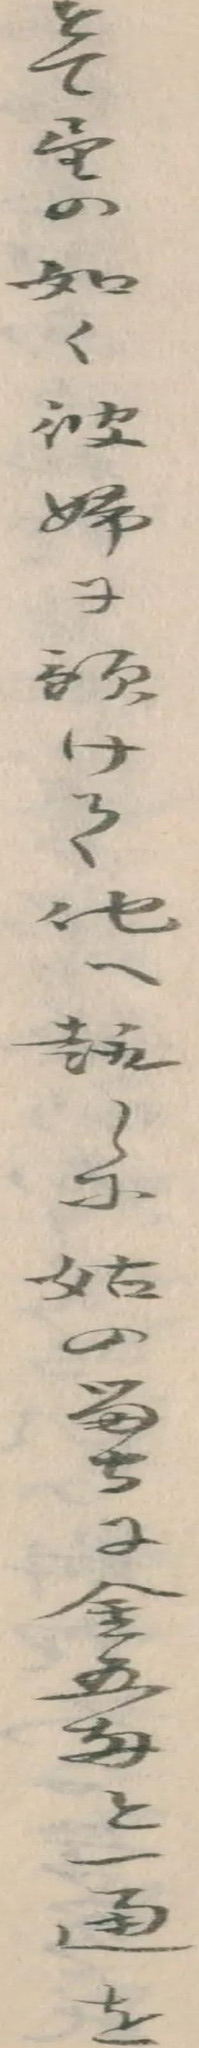とて望の如く彼婦に預けて他へ趣しに姑の留守に金五両と一通を
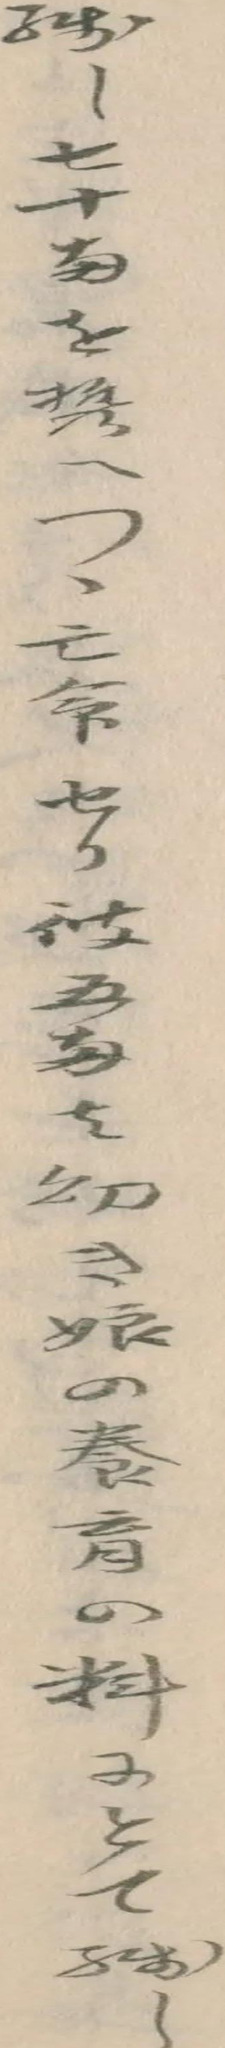残し七十両を携へつゝ亡命せり彼五両は幼き娘の養育の料にとて残し
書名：地災撮要. 巻7-9(地震之部)
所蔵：国立国会図書館 National Diet Library, JAPAN
